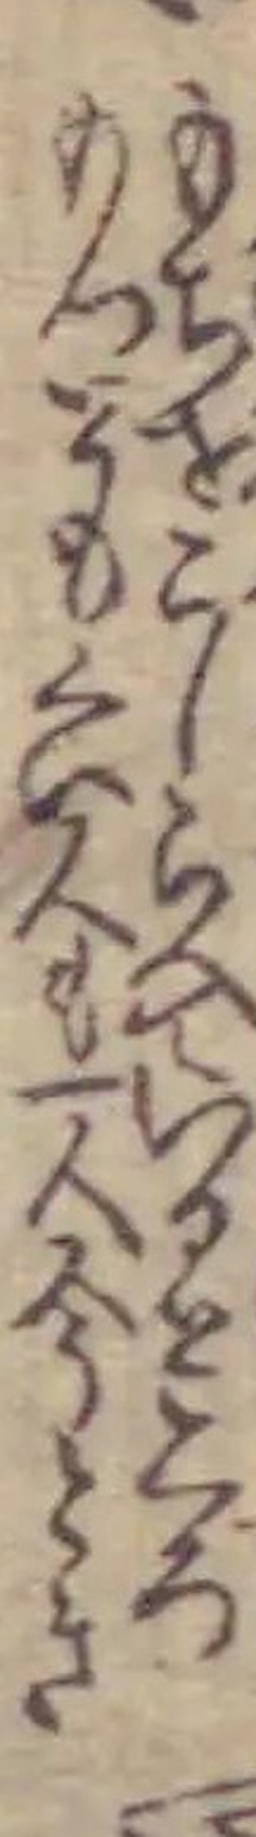もつともくい人も一人今とき
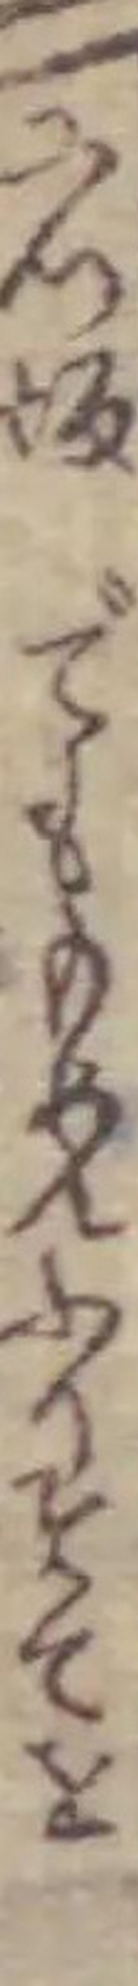につ坂でももめんふりそてを
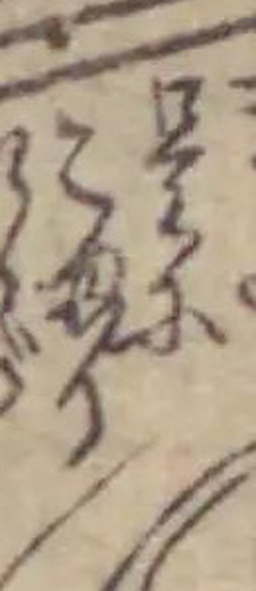こまり
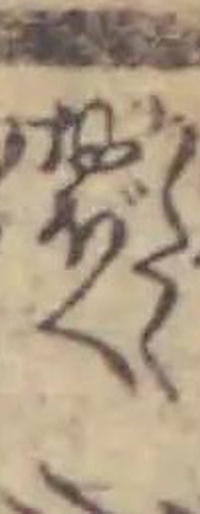おぼへ
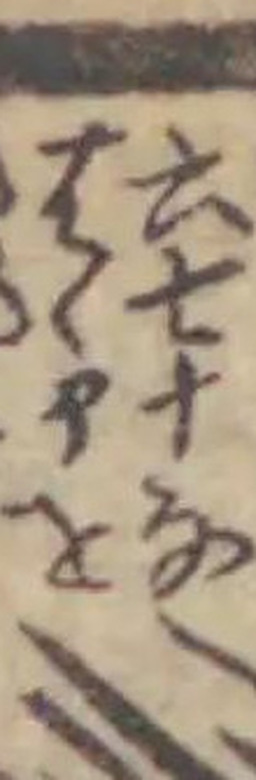はヽアを
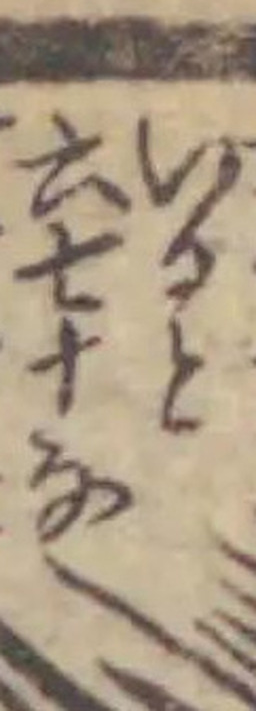六七十な
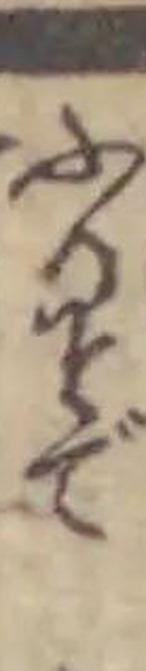ふりそで
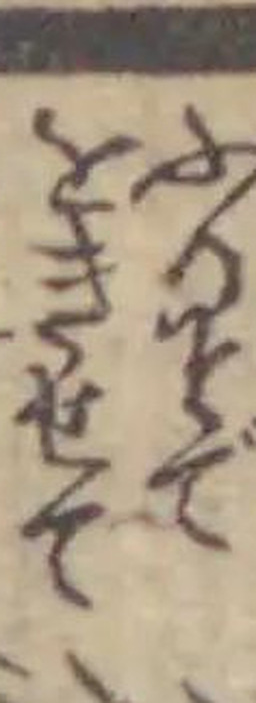をきせて
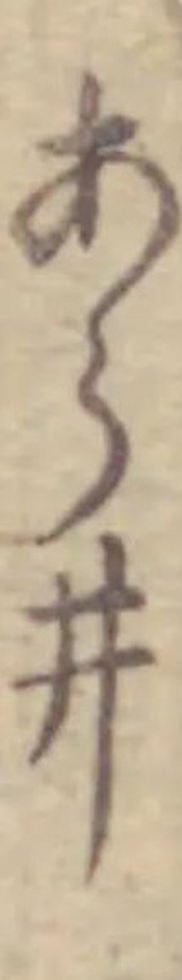あら井

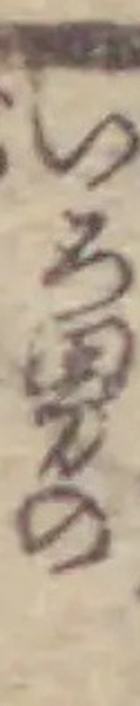いろ男の
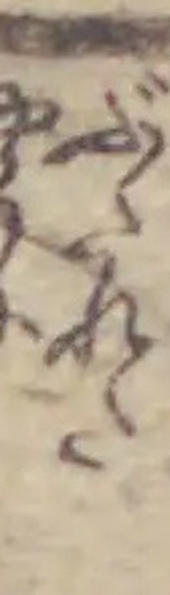ぶたれた
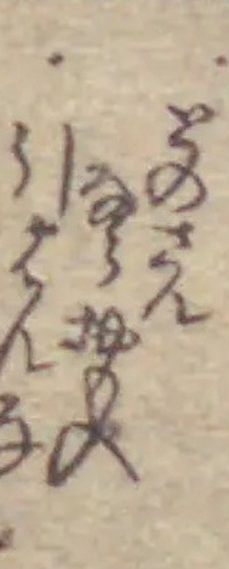ならおも入
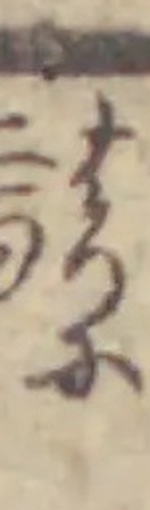はりに
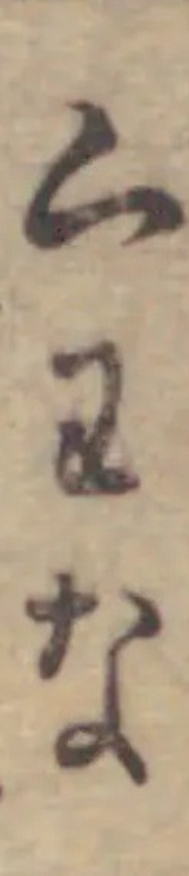くわな
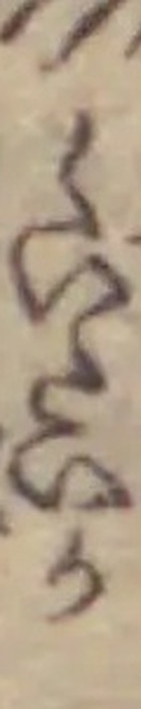くいたいか
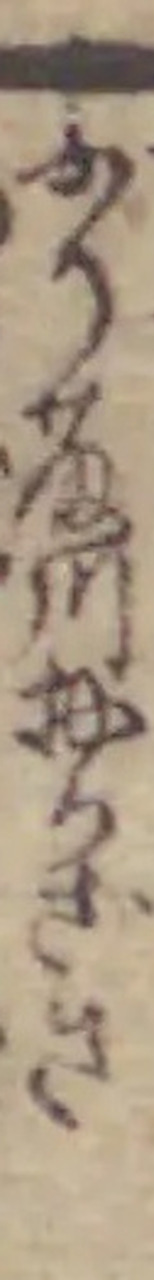ふり藤川おかざき
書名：道笑双六
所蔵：国立国会図書館 National Diet Library, JAPAN
